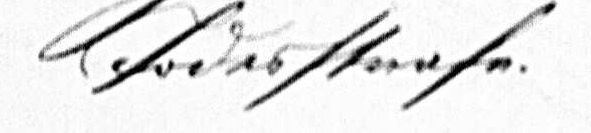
Todesstrafe.
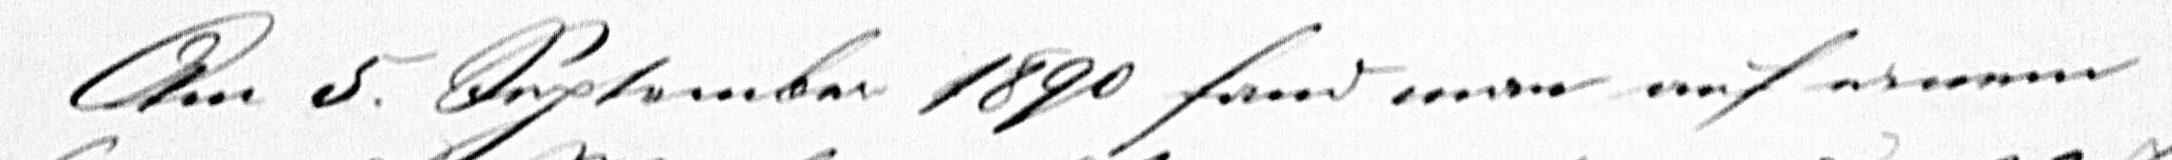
Am 5. September 1890 fand man auf einem
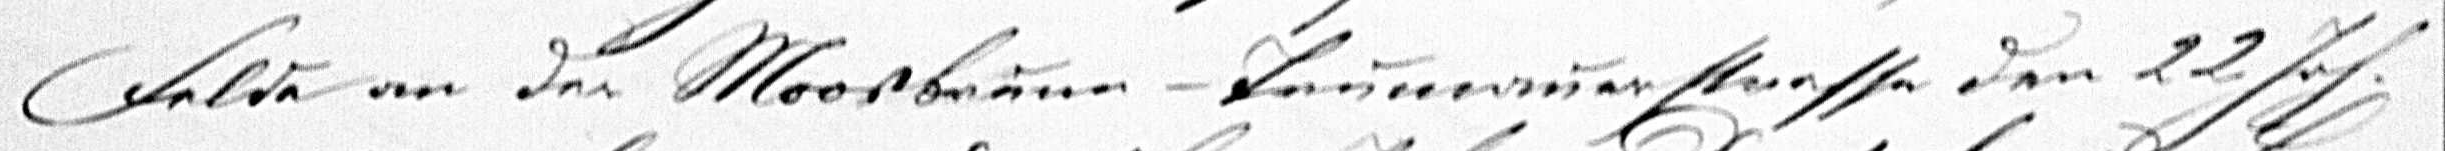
Felde an der Moosbrunn-Trumauer-strasse den 22 Jah¬
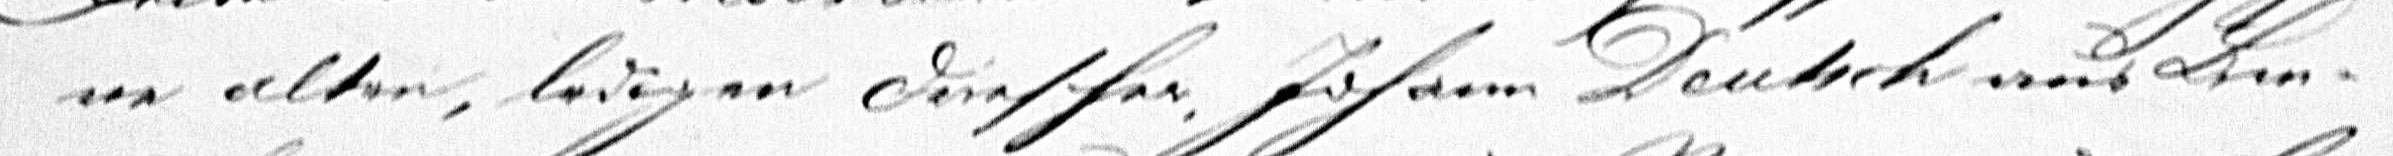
re alten, ledigen Drescher Johann Deutsch aus Lie¬
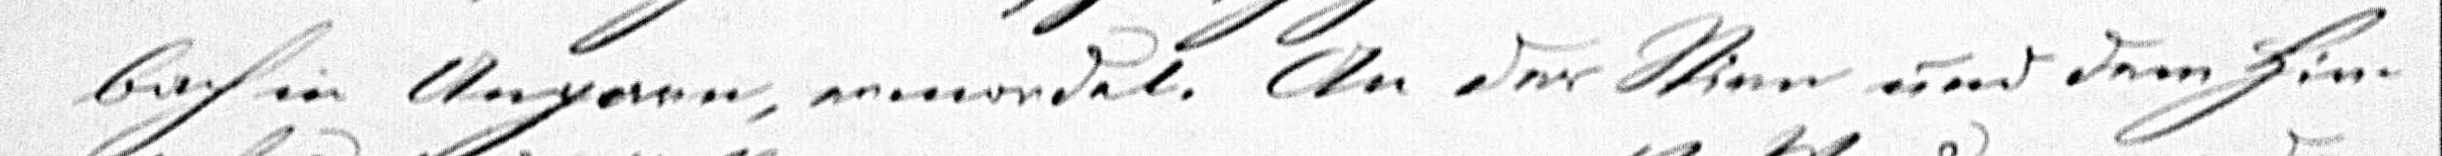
bach in Ungarn, ermordet. An der Stirn und dem Hin¬
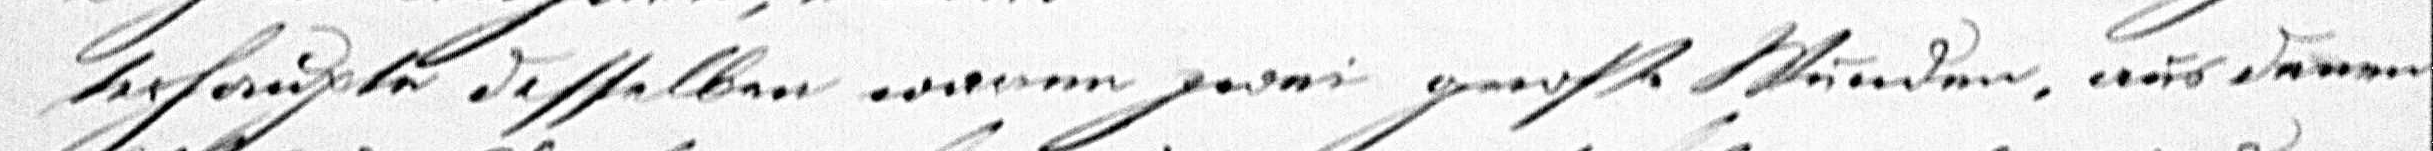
terhaupte desselben waren zwei große Wunden, aus denen
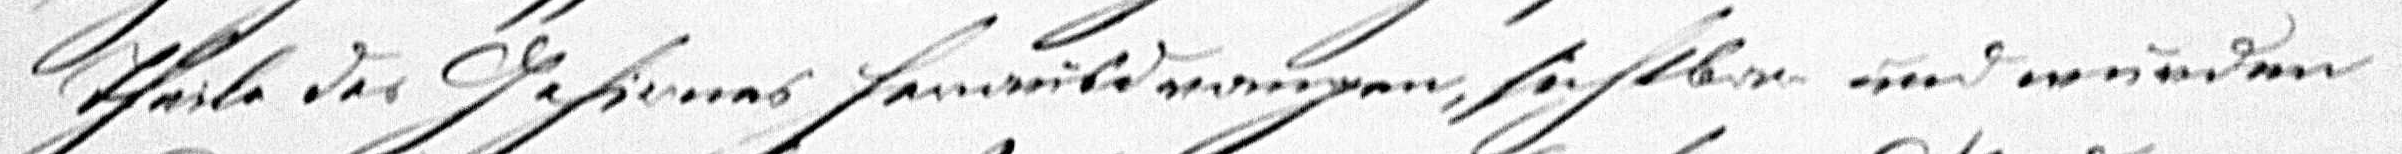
Theile der Gehirnes herausdrangen, sichtbar und wurden
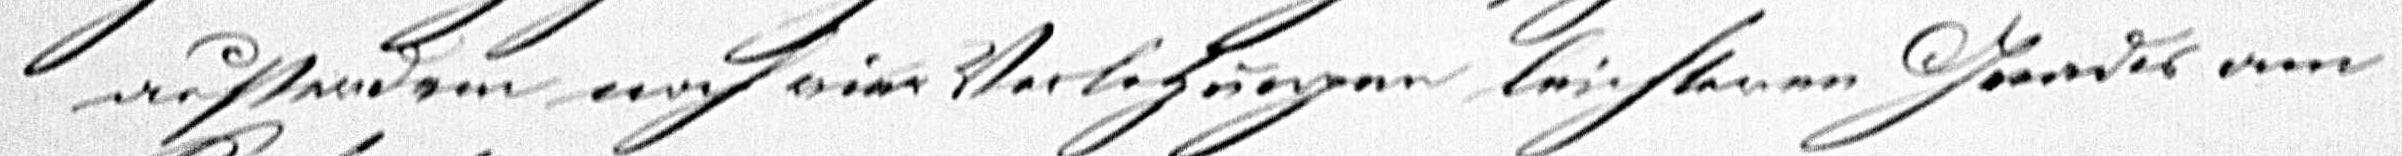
außerdem noch vier Verletzungen leichteren Grades am
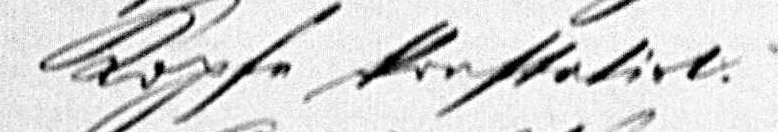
Kopfe konstatirt.
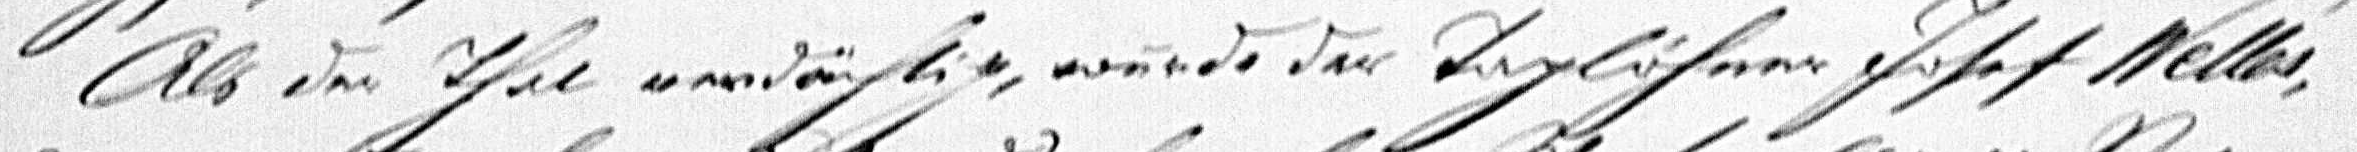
Als die That verdächtig wurde der Taglöhner Josef Welles,
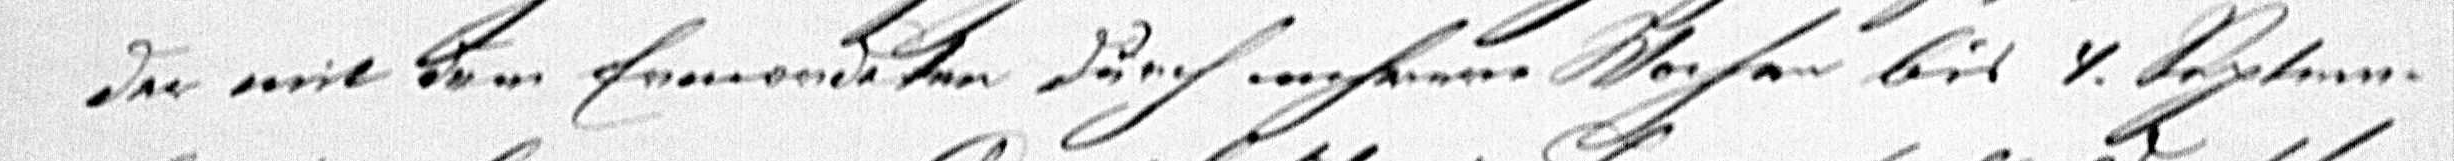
der mit dem Ermordeten durch mehrere Wochen bis 4. Septem¬
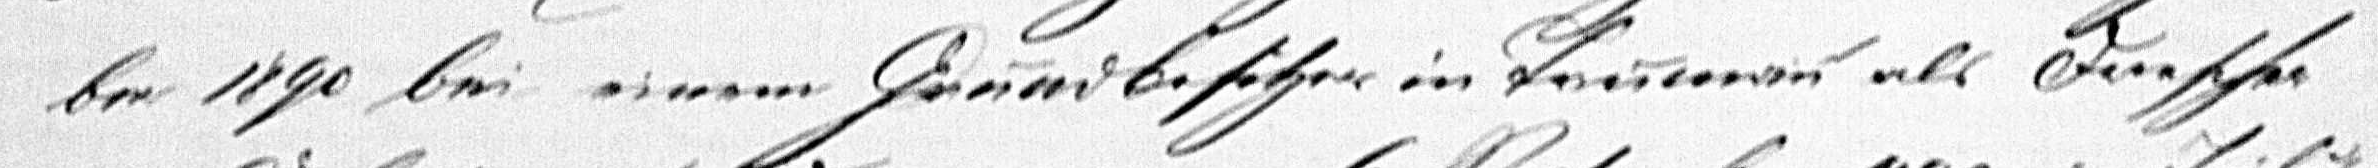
ber 1890 bei einem Grundbesitzer in Trumau als Drescher
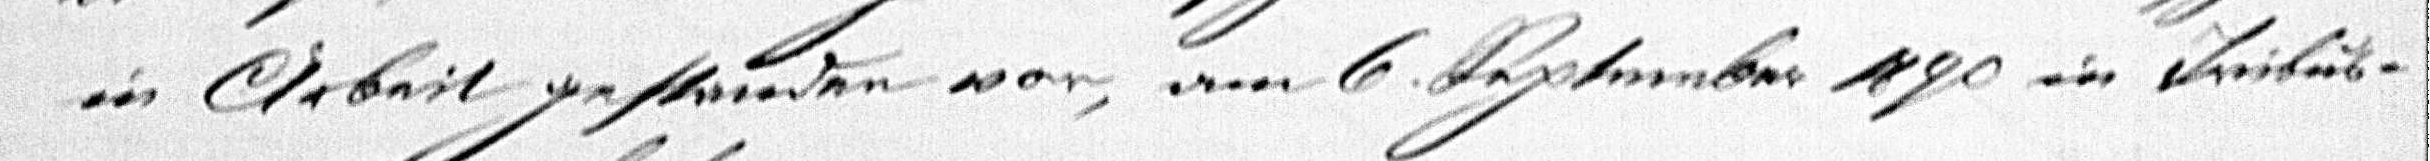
in Arbeit gestanden war, am 6. September 1890 in Tribus¬
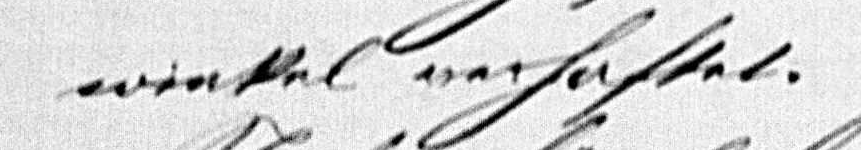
winkel verhaftet.
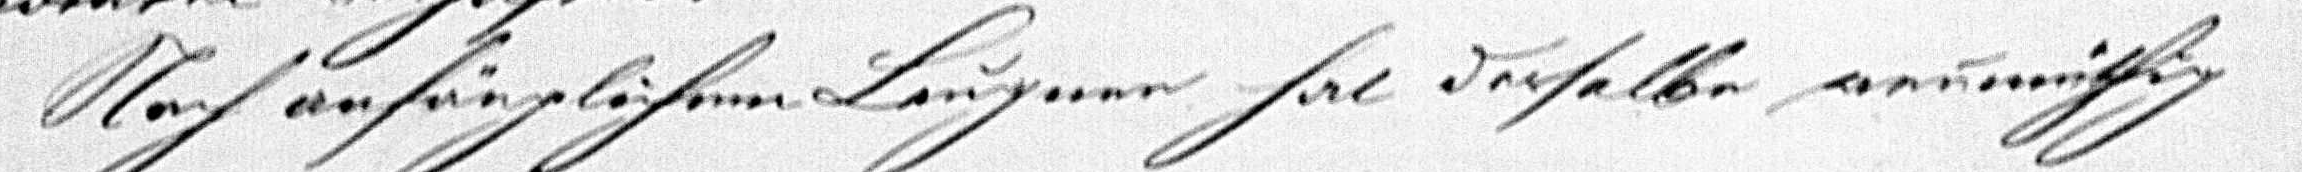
Nach anfänglichem Leugnen hat derselbe reumüthig
